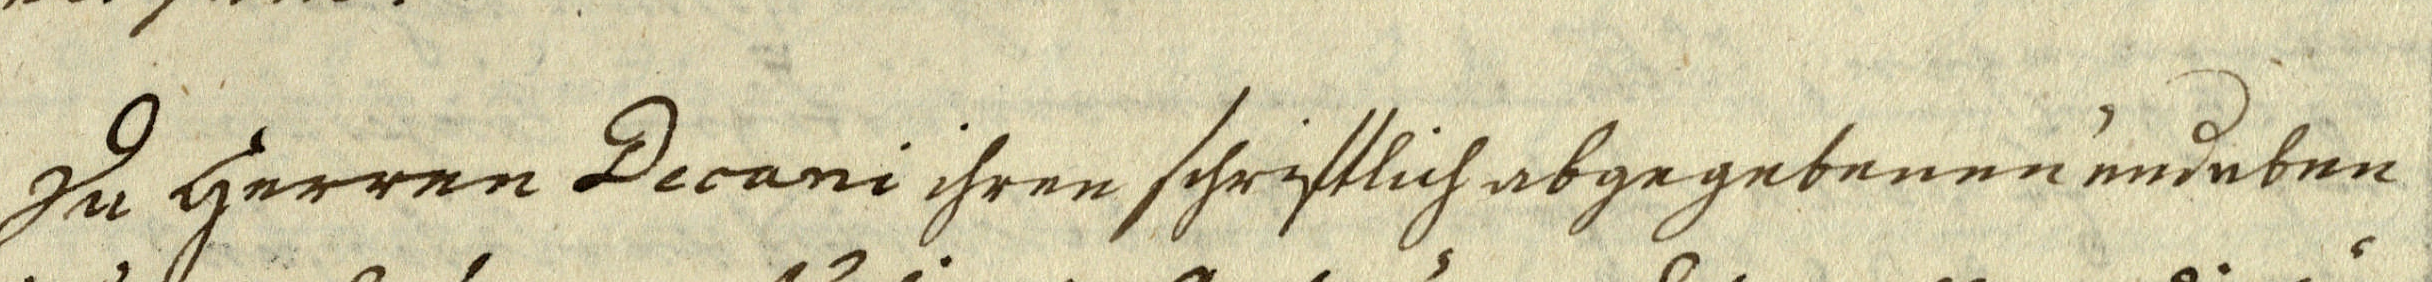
Da Herren Decani ihren schriftlich abgegebenen und eben
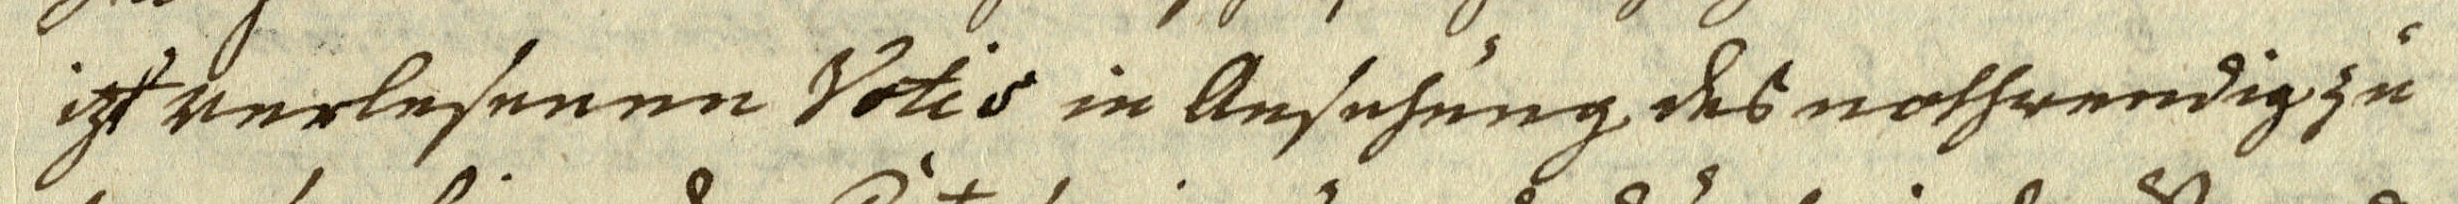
itzt verlesenen Votis in Ansehung des nothwendig zu
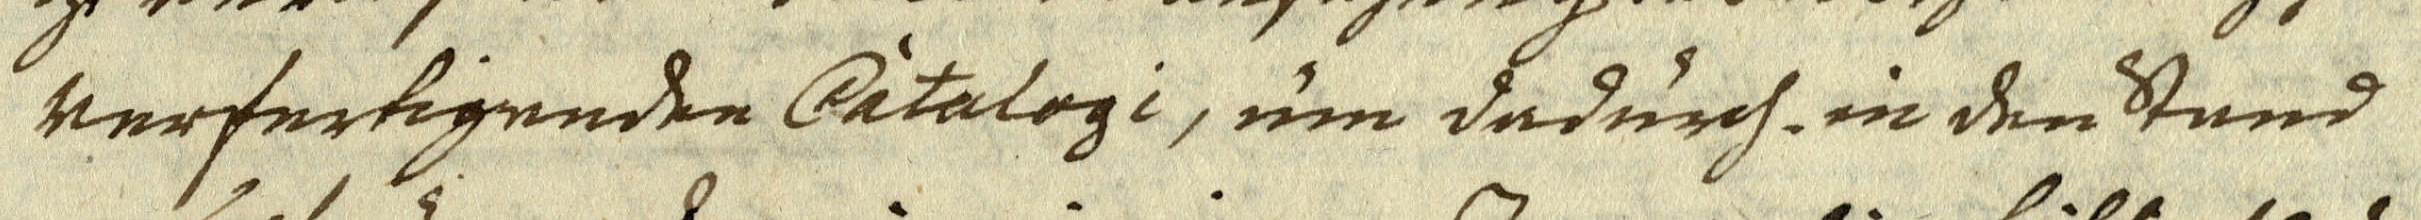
verfertigenden Catalogi, um dadurch, in den Stand
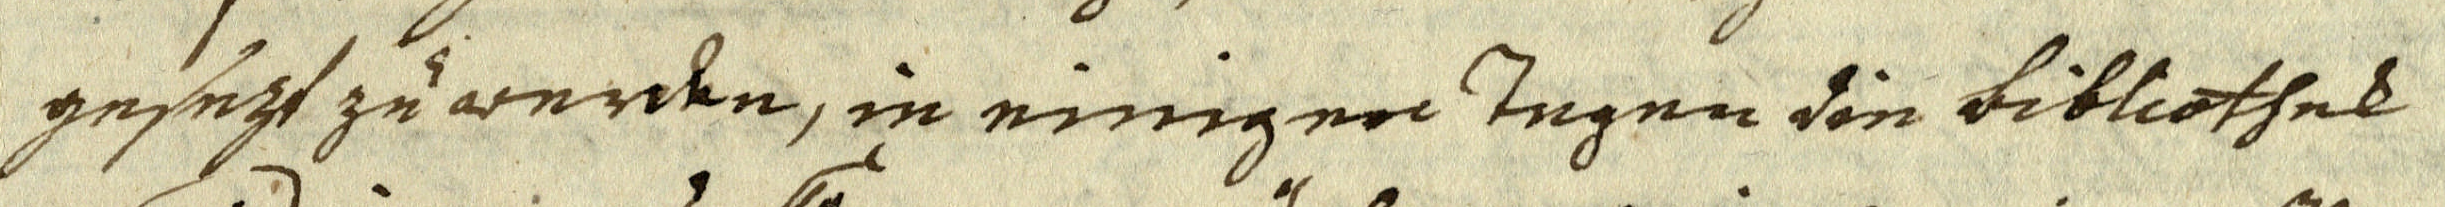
gesetzt zu werden, in einigen Tagen die Bibliothek
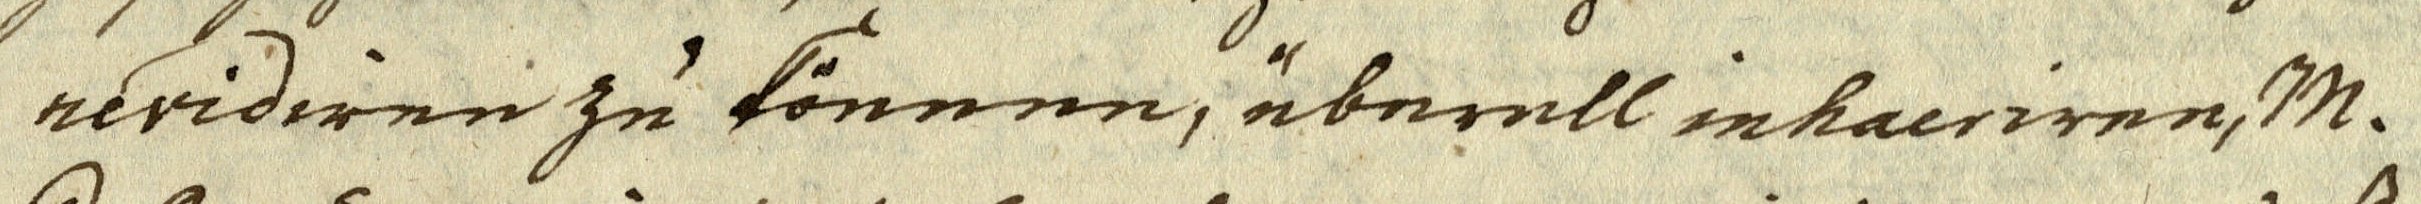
revidiren zu können, überall inhaeriren, M.
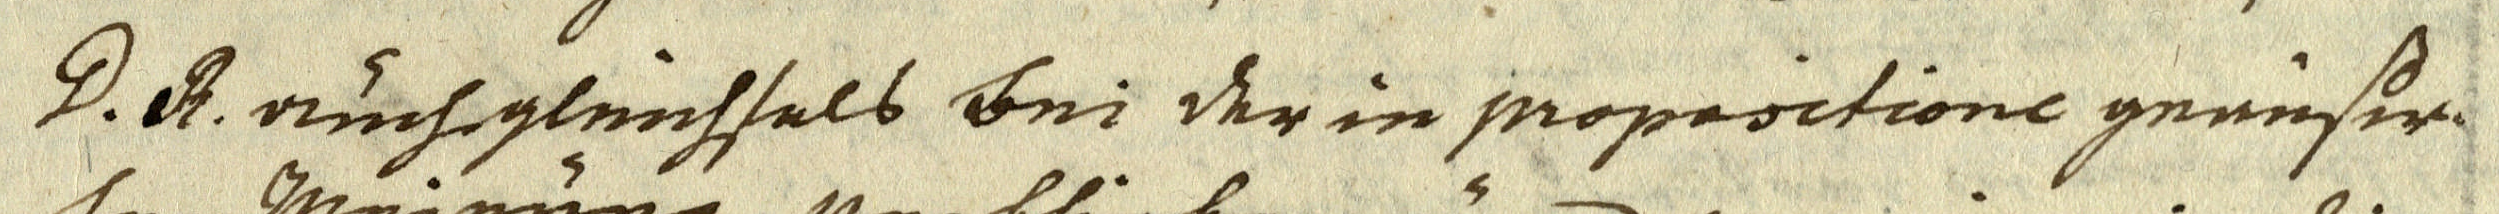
D. R. auch gleichfals bei der in propositione geäußer¬
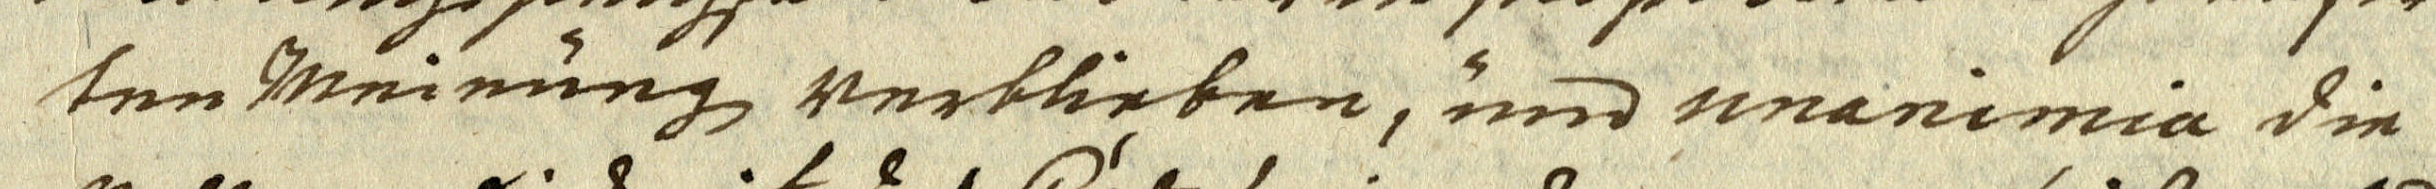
ten Meinung verblieben, und unanimia die
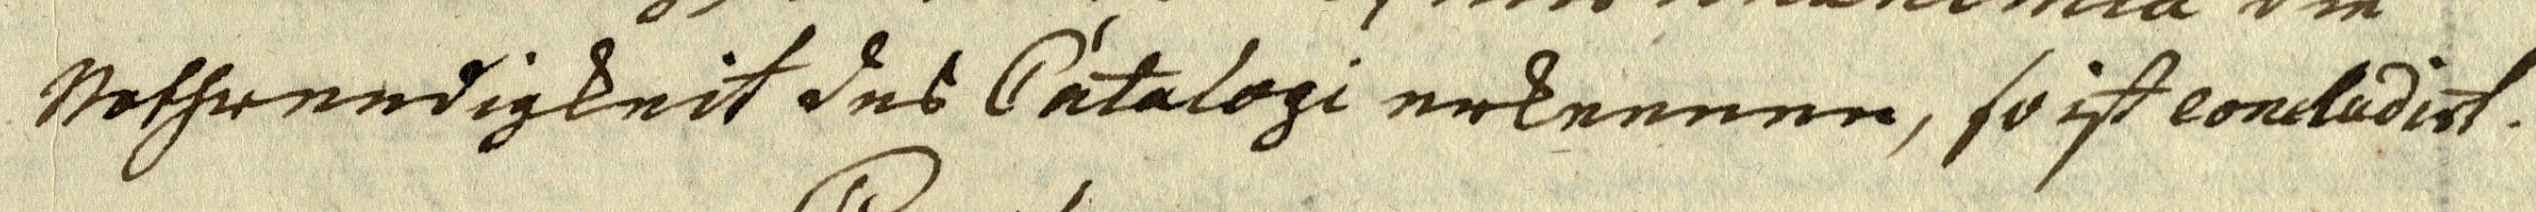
Nothwendigkeit des Catalogi erkennen, so ist concludirt.
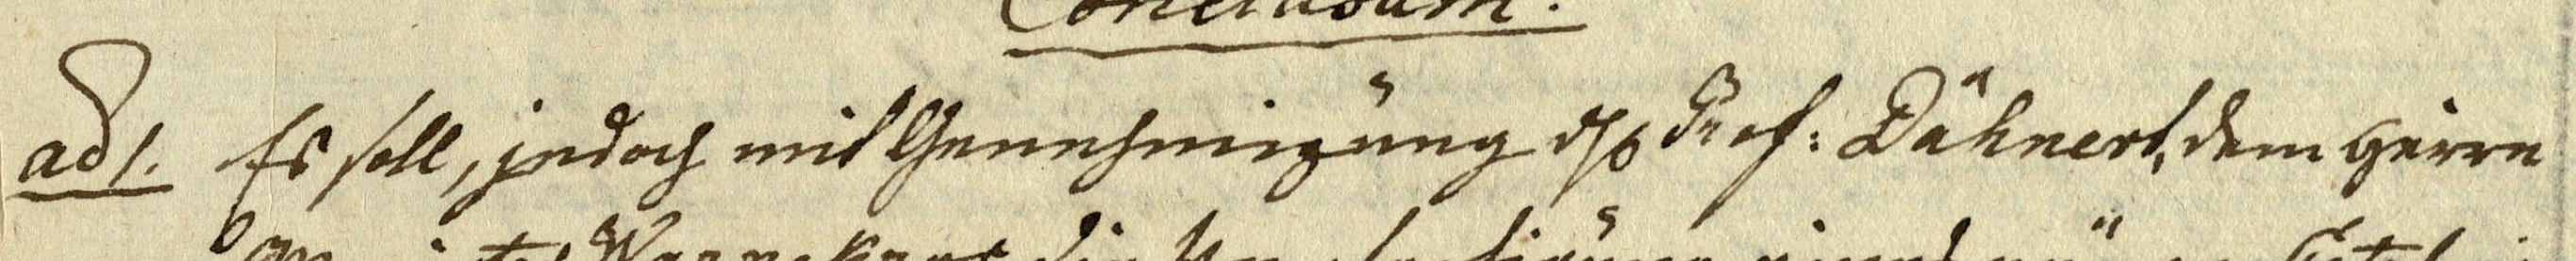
ad 1. Es soll, jedoch mit Genehmigung dh Prof: Dähnert, dem Herrn
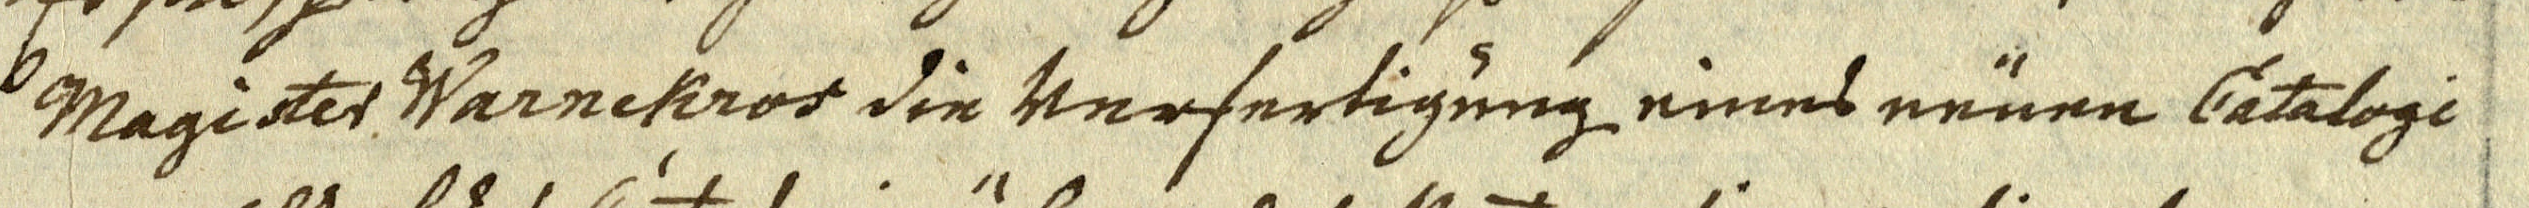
Magister Warnekros die Verfertigung eines neuen Catalogi
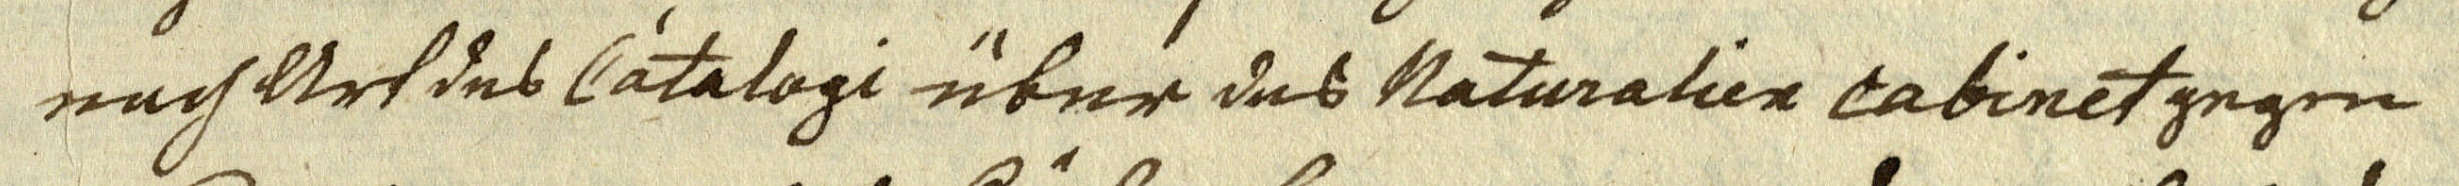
nach Art des Catalogi über das Naturalien Cabinet gegen
